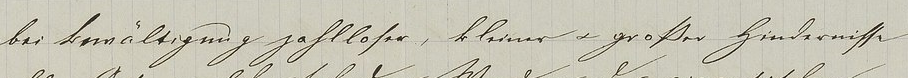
bei Bewältigung zahlloser, kleiner & großer Hindernisse
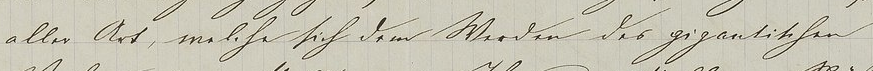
aller Art, welche sich dem Werden des gigantischen
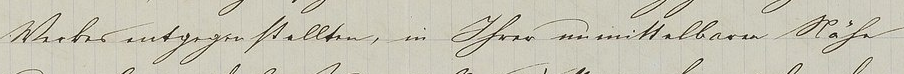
Werkes entgegenstellten, in Ihrer unmittelbaren Nähe
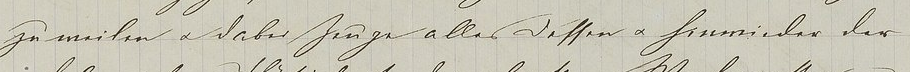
zu weilen & dabei Zeuge alles dessen & hinwieder der
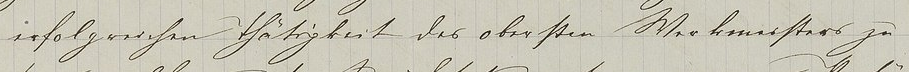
erfolgreichen Thätigkeit des obersten Werkmeisters zu
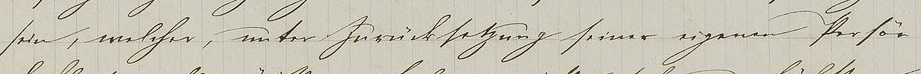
sein, welcher, unter Zurücksetzung seiner eigenen Persön-
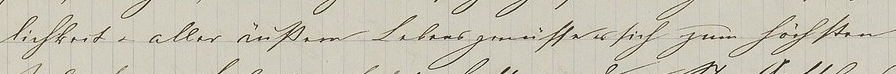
lichkeit & aller äußern Lebensgenüsse es sich zum höchsten
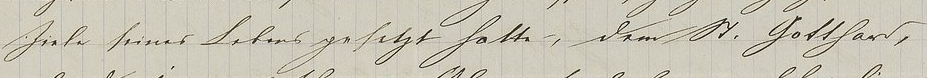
Ziele seines Lebens gesetzt hatte, dem St. Gotthard,
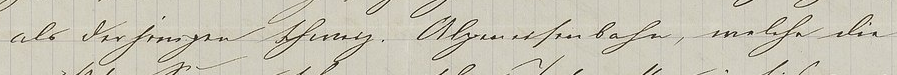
als derjenigen schweiz. Alpeneisenbahn, welche die
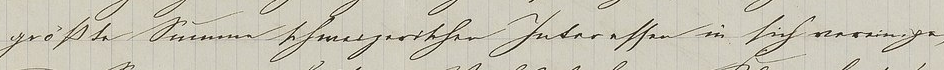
größte Summe schweizerischer Interessen in sich vereinige,
